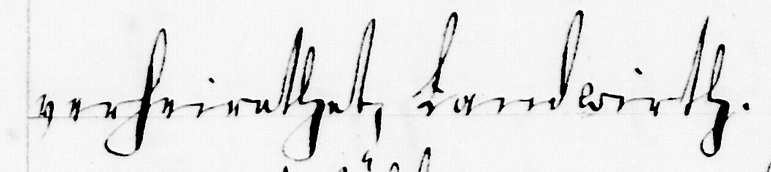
verheirathet, Landwirth.
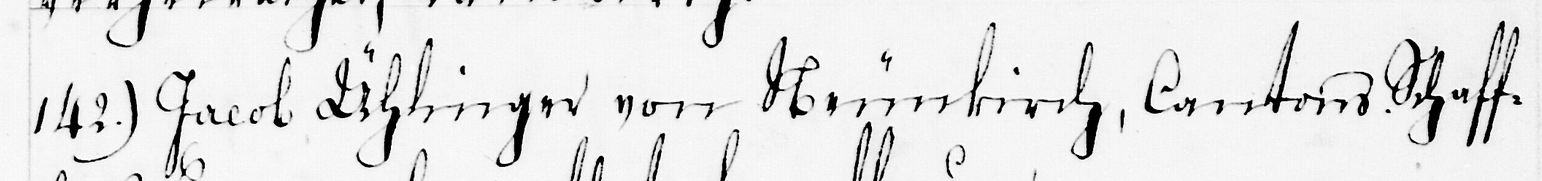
142.) Jacob Ühlinger von Neunkirch, Cantons Schaff¬
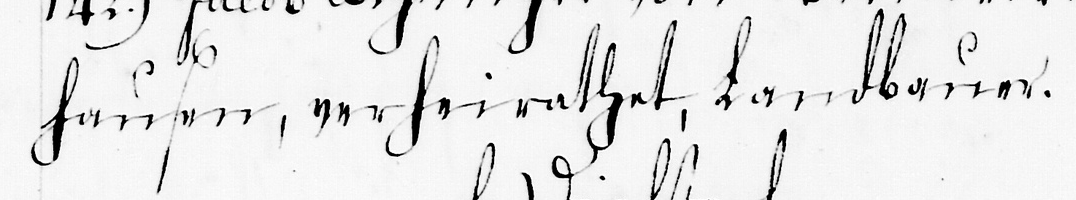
hausen, verheirathet, Landbauer.
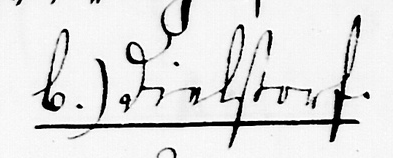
b.) Dielstorf.
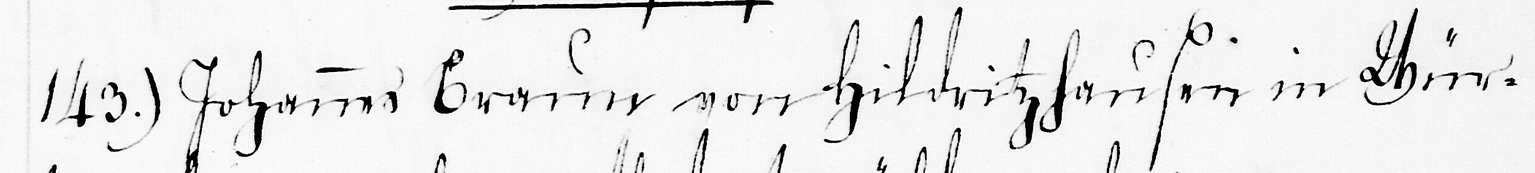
143.) Johannes Braun von Hildritzhausen in Wür¬
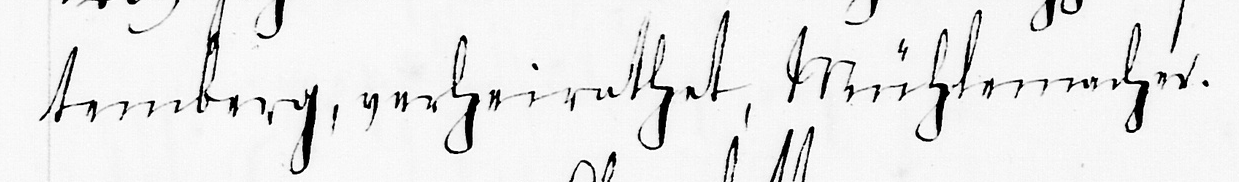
temberg, verheirathet, Mühlemacher.
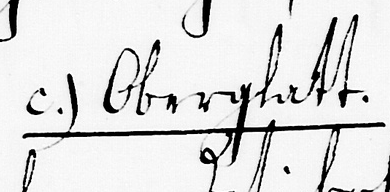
Oberglatt.
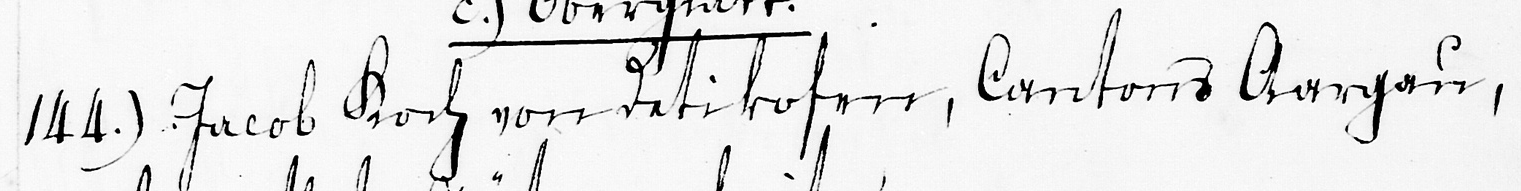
144.) Jacob Koch von Detikofen, Cantons Aargau,
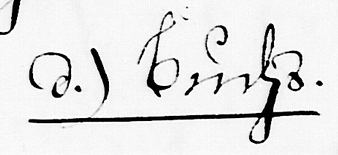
d.) Buchs.
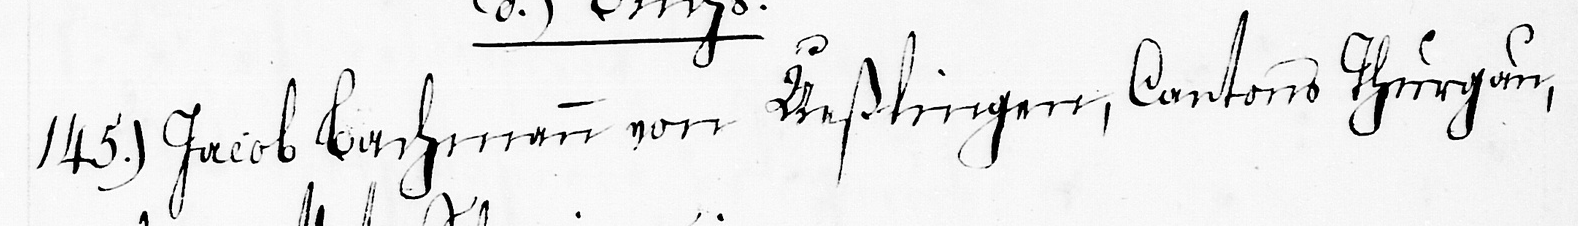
145.) Jacob Bachmann von Ueßlingen, Cantons Thurgau,
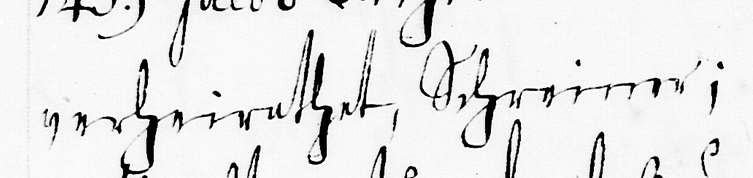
verheirathet, Schreiner;
